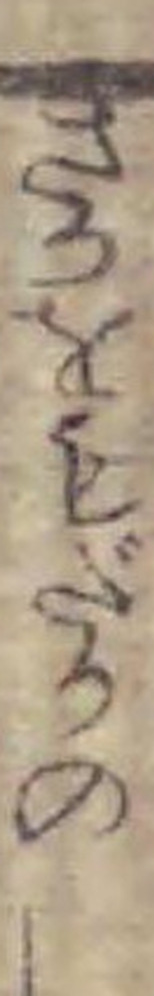さかをもだかの
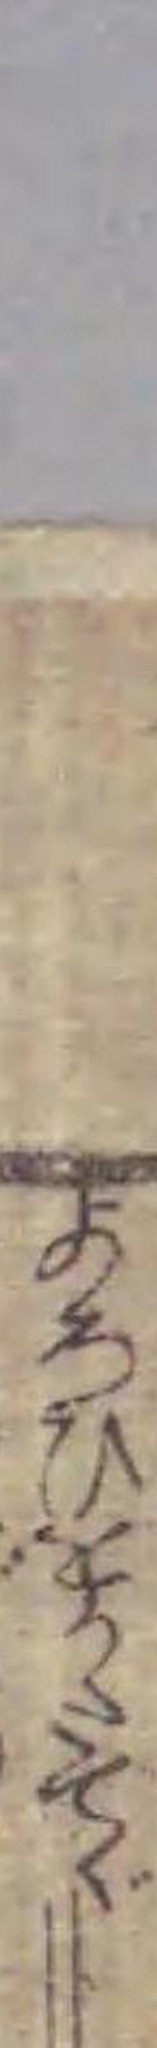よろひをかたてゞ
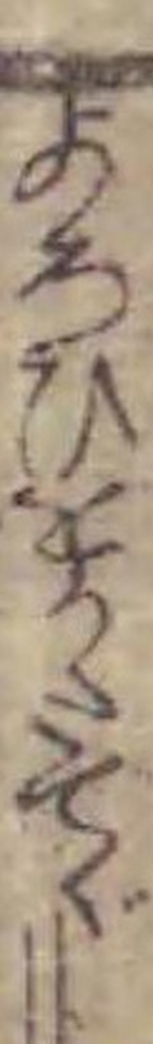よろひをかたてゞ
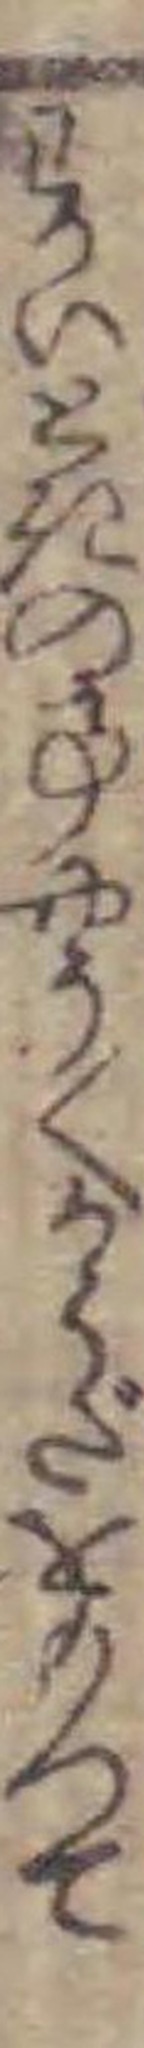わかいときの事やう〳〵からだをもつて
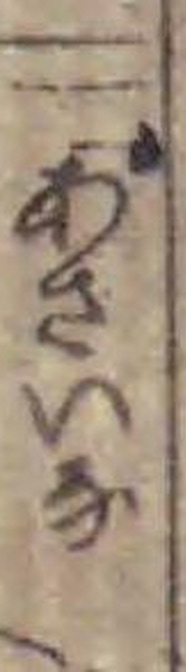あさいな
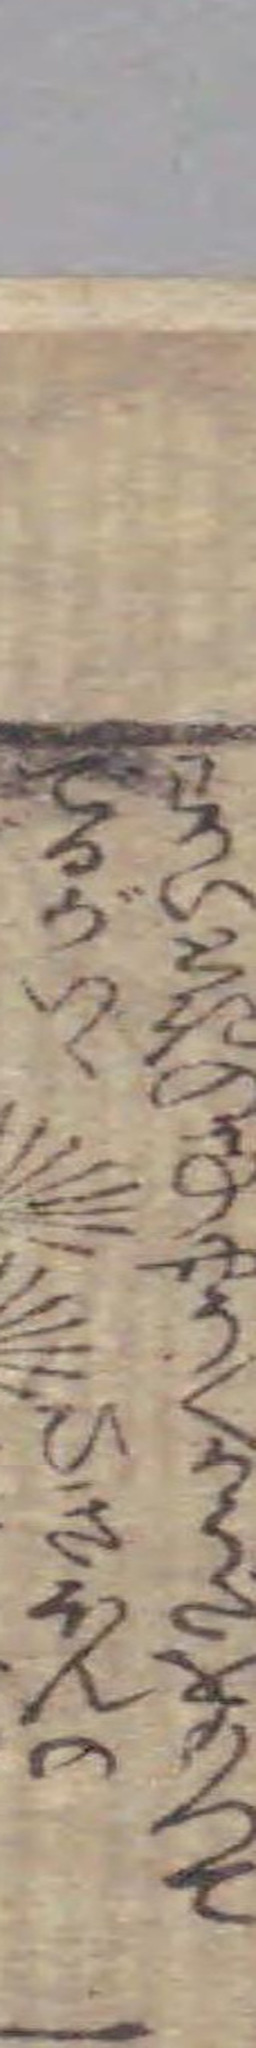でるがいゝひきほんの
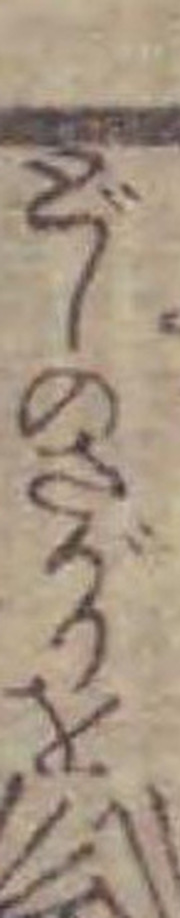どしのさがりを
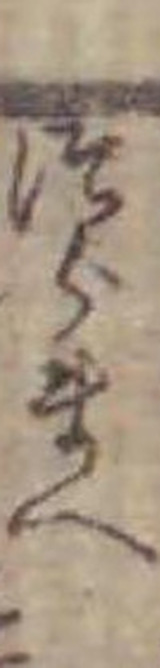つらまへ
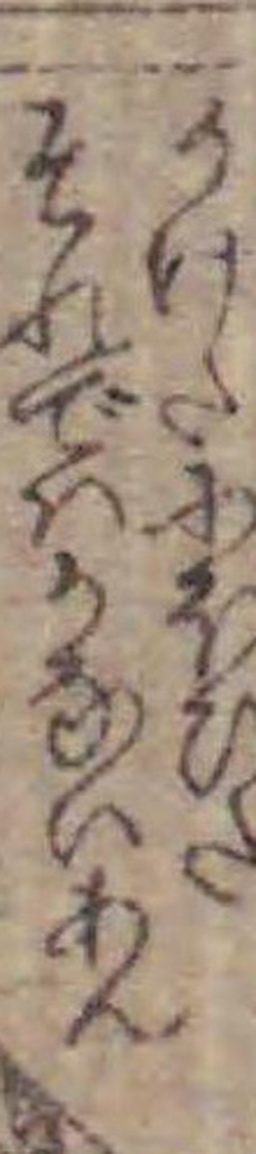それではかないあん
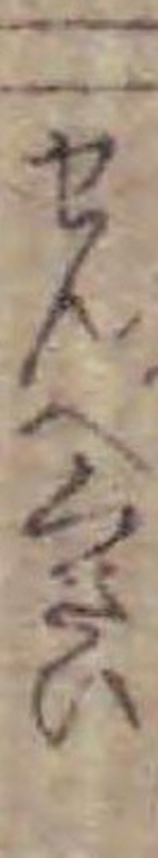せんへくさい
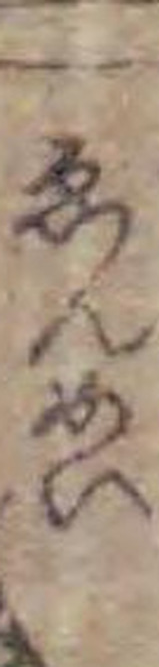ゑんめい
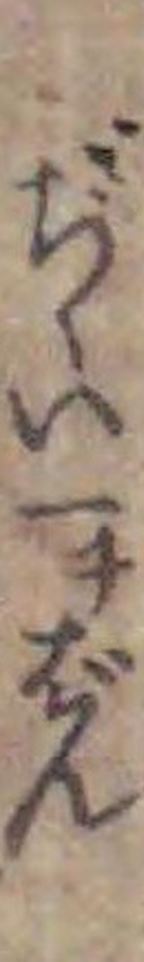ぢゝい一
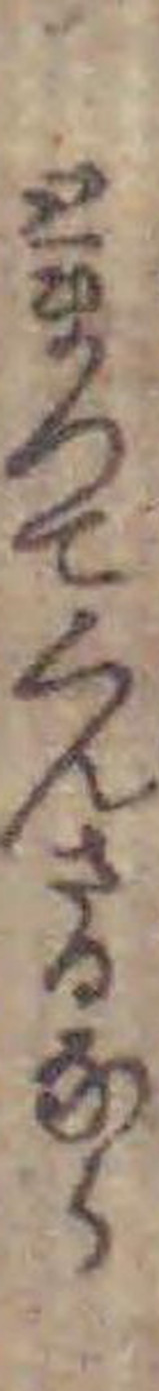とまつてくんさるなら
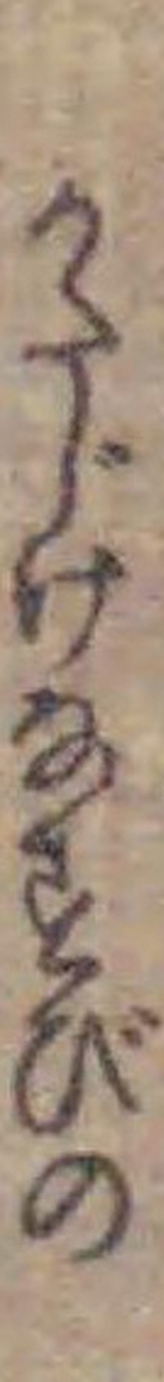かたじけなすびの
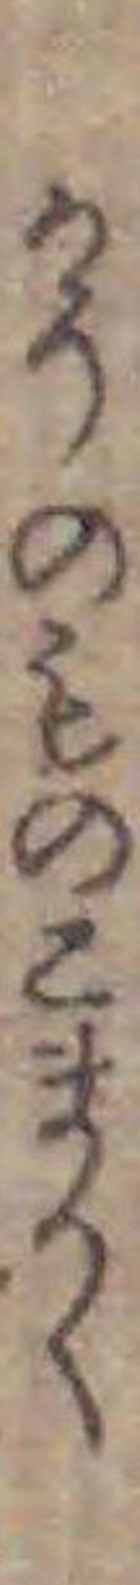かうのものこまかく
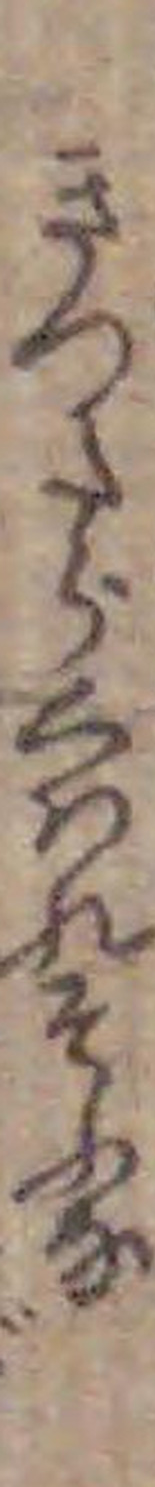きつたらくはれそふな
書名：年寄之冷水曽我 : 3巻
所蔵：国立国会図書館 National Diet Library, JAPAN
